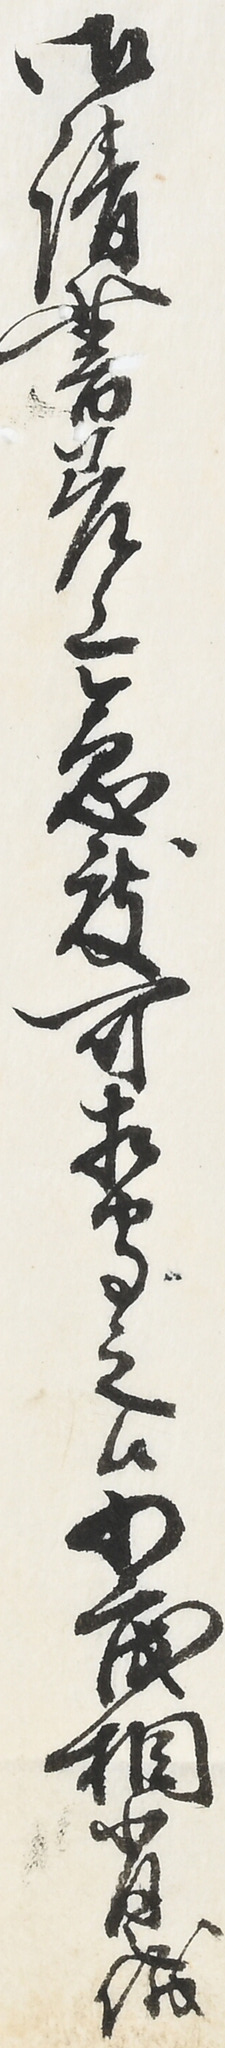請書差上急度可相守之候少茂相背儀

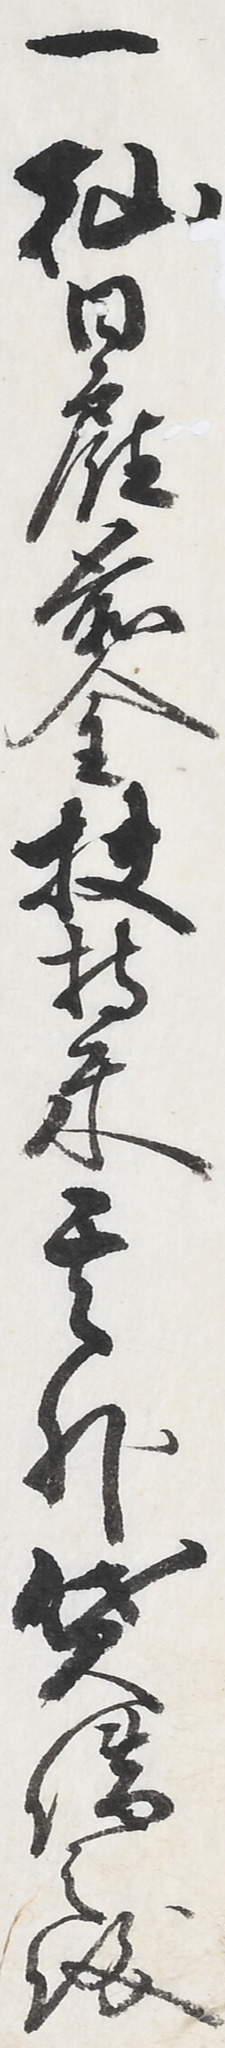一杣日雇前金扶持米其外貸借之儀
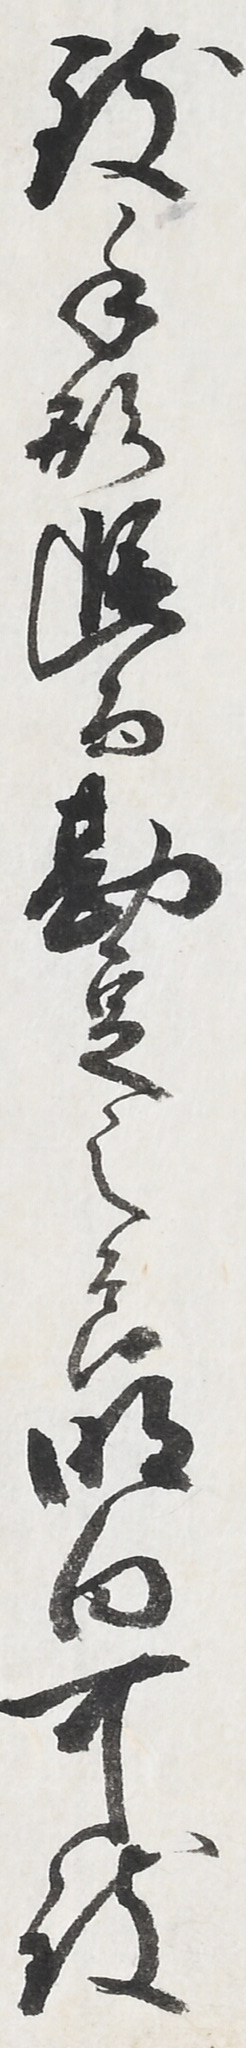致手形追而勘定之節明白可致
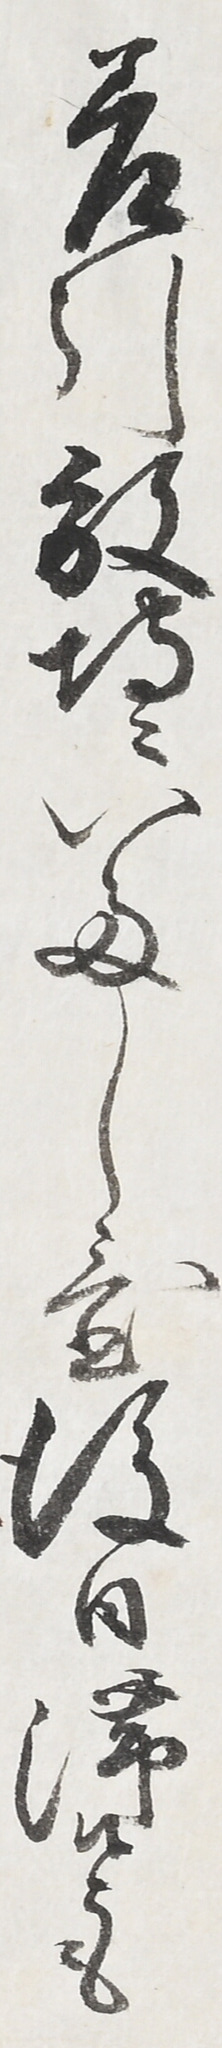差引放埒ニいたし置後日滞候とも
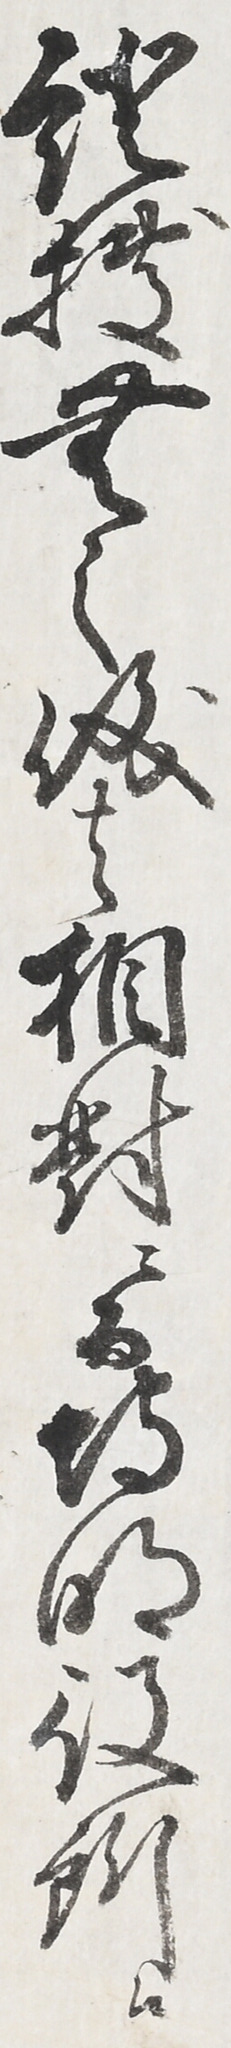証拠無之儀者相対ニ而埒明役所江
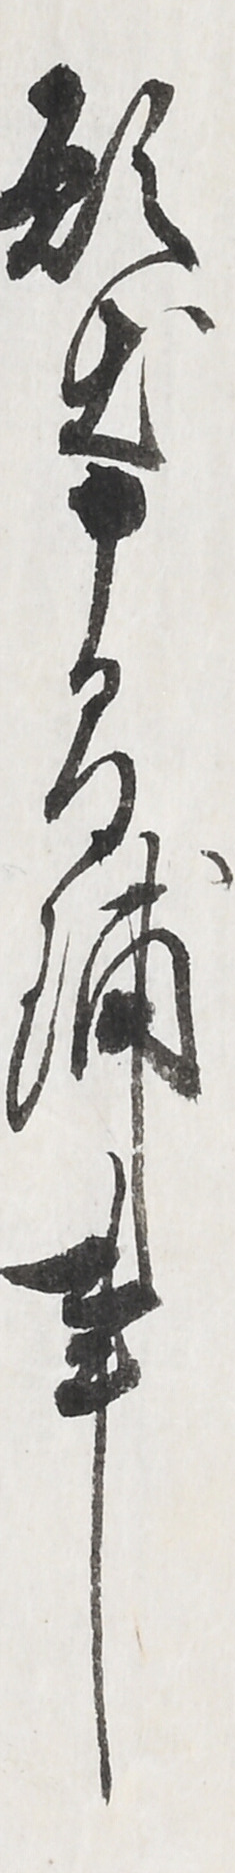願出申間敷事
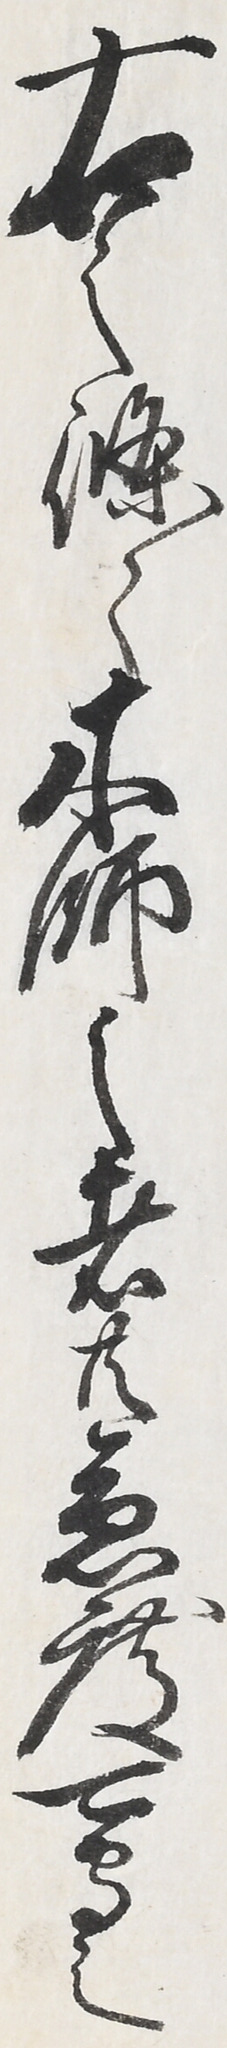右之條々木師之者共急度可守之
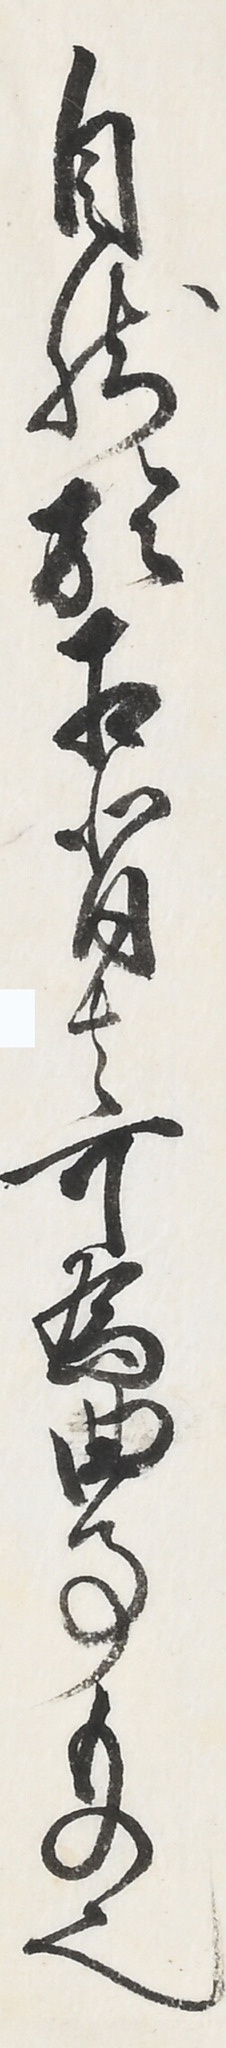自然於相背者可為曲事もの也
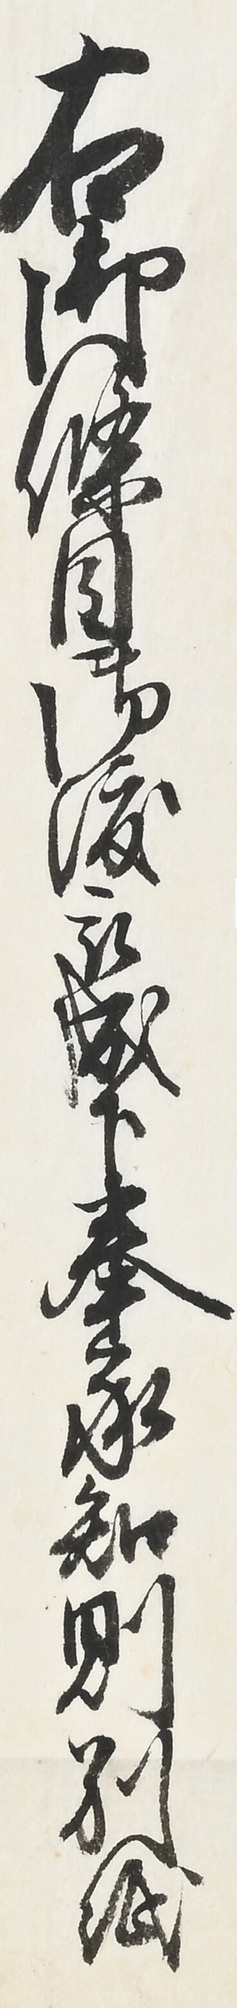右御條目御渡被成下奉承知則別紙
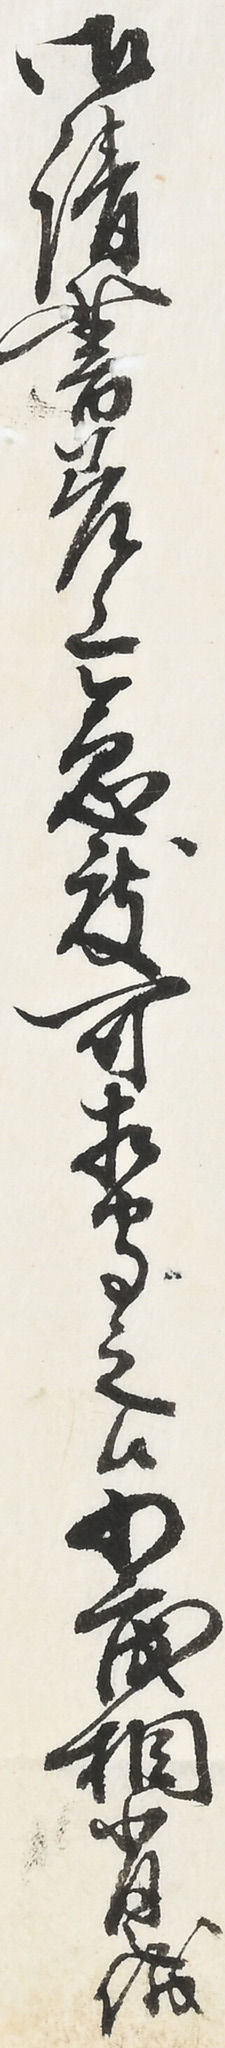請書差上急度可相守之候少茂相背儀

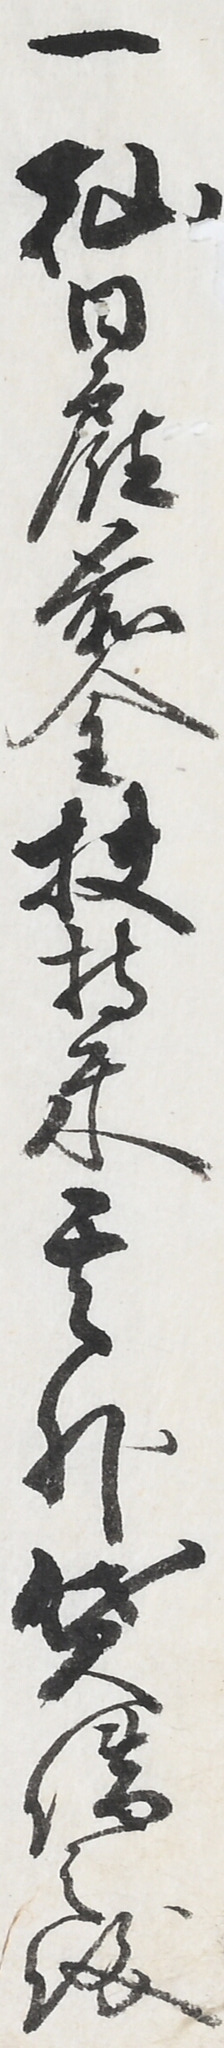一杣日雇前金扶持米其外貸借之儀
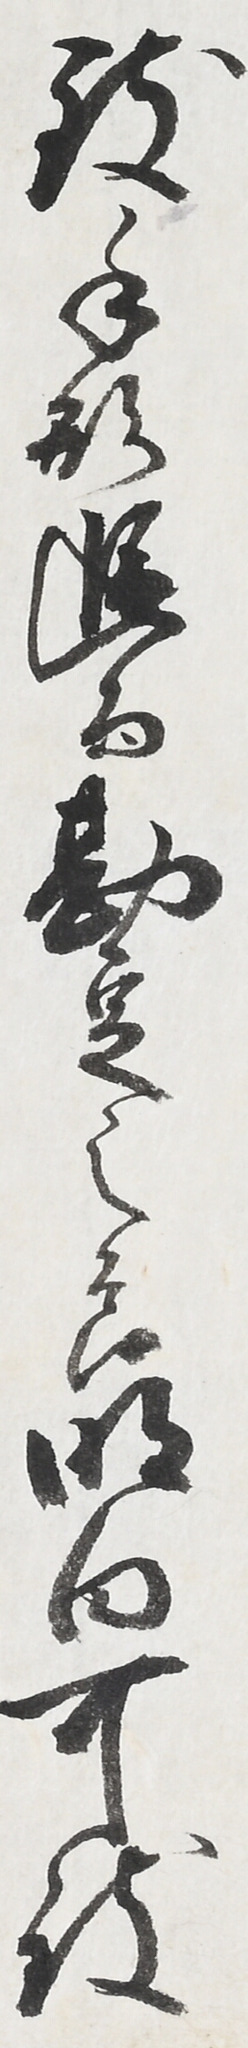致手形追而勘定之節明白可致
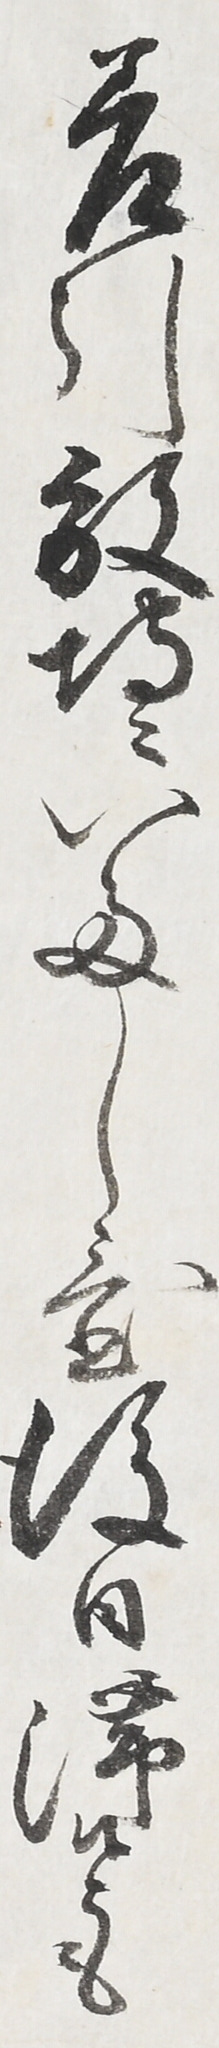差引放埒ニいたし置後日滞候とも
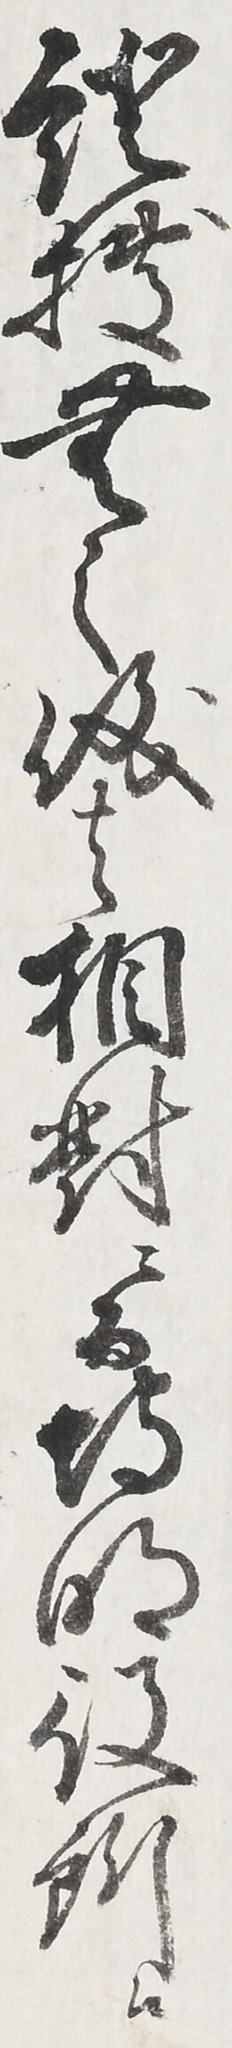証拠無之儀者相対ニ而埒明役所江
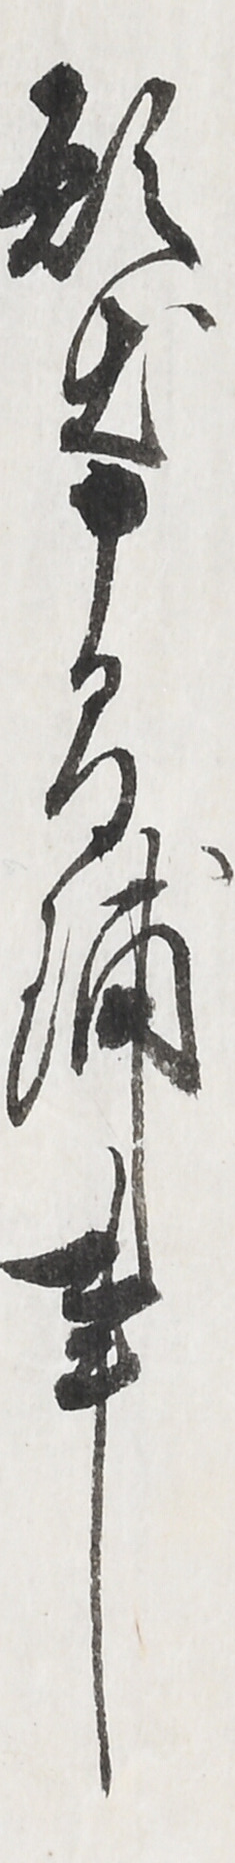願出申間敷事
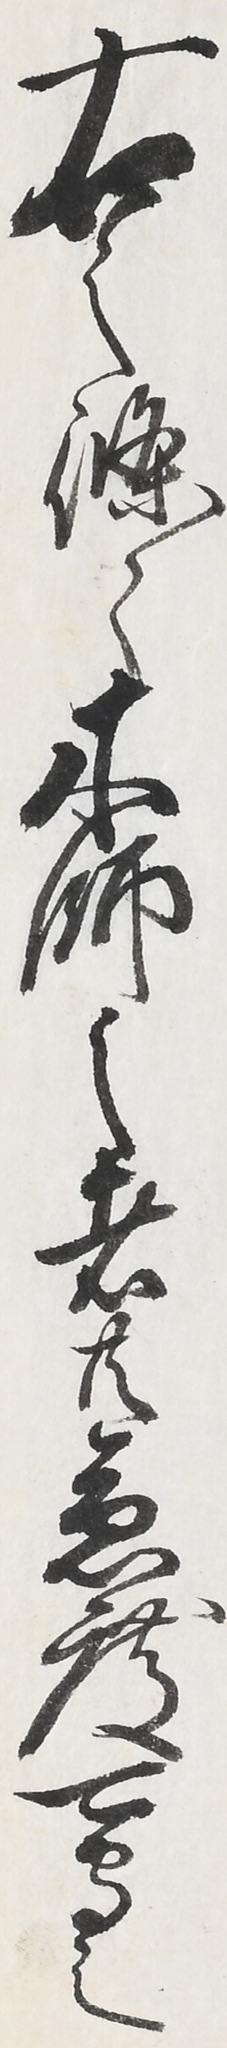右之條々木師之者共急度可守之
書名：小白木條目請書并判取帳
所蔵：伊那市立高遠町図書館・合同会社AMANE
